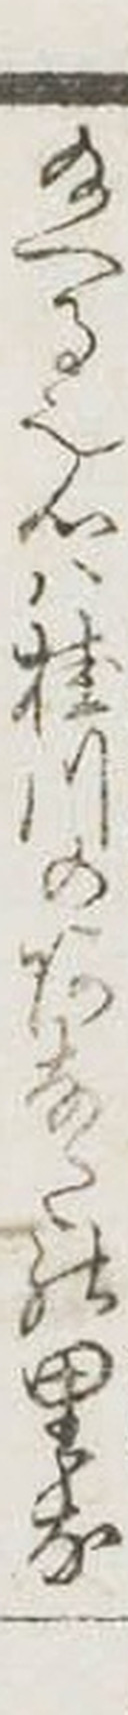給へる也心は桂川のあなたの里な
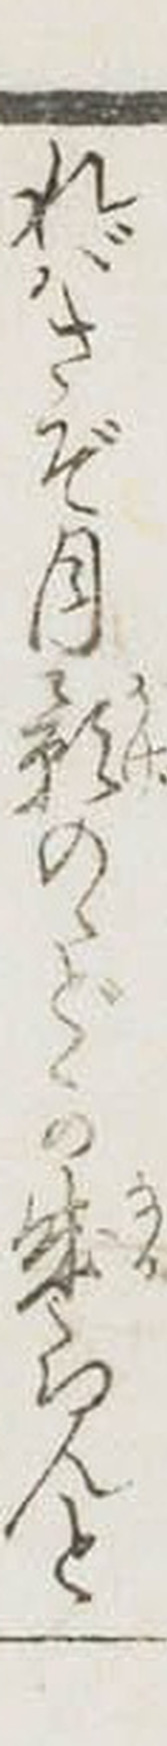ればさぞ月影のゝどか成らんと
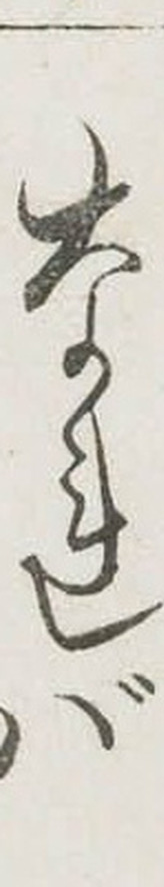なれば
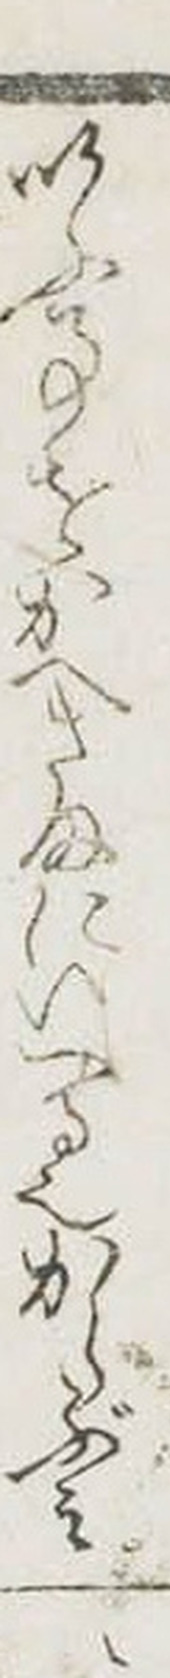いふ事をかへさまにいへる也からぶみ
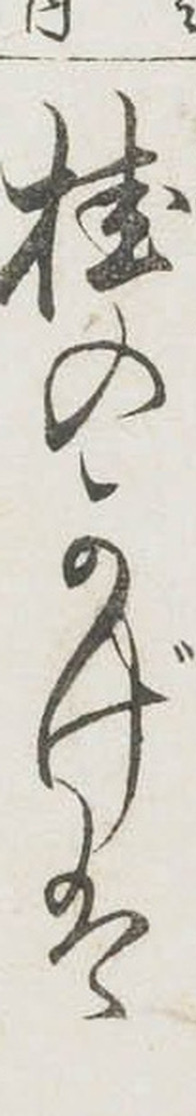桂のかげは
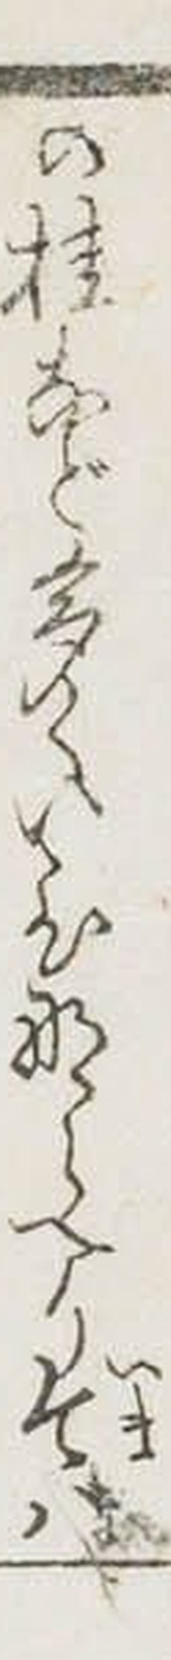の桂など多くいひならへり今は
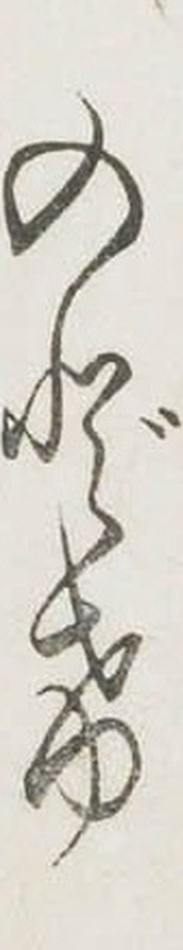のどけ
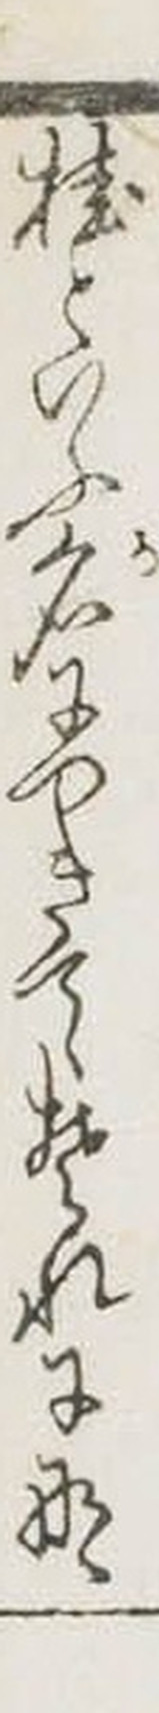桂といふ名につきてそれにな
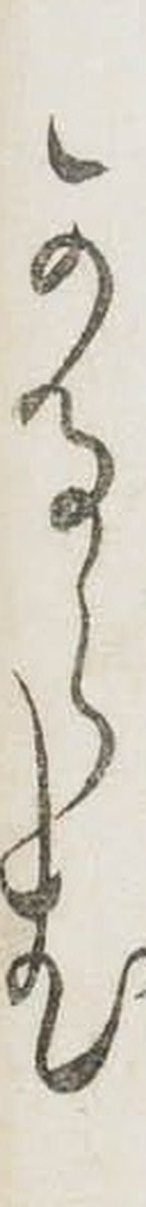かるらむ
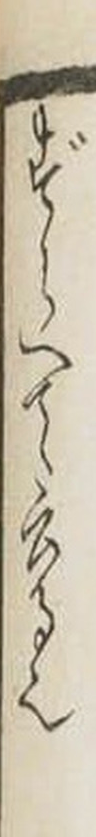ずらへて云る也
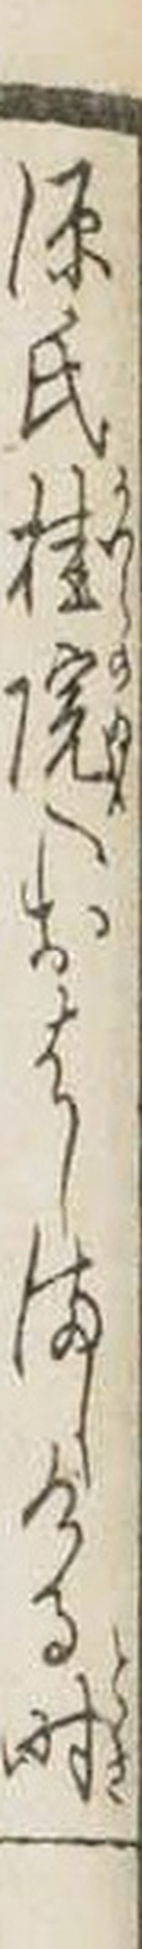源氏桂院へおはしましける時
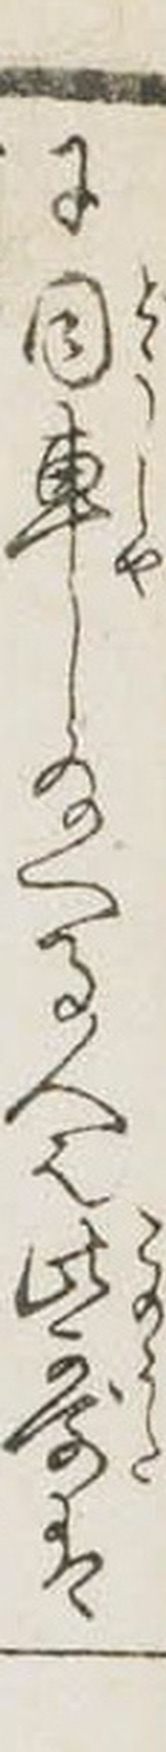に同車し給へる人也此哥は
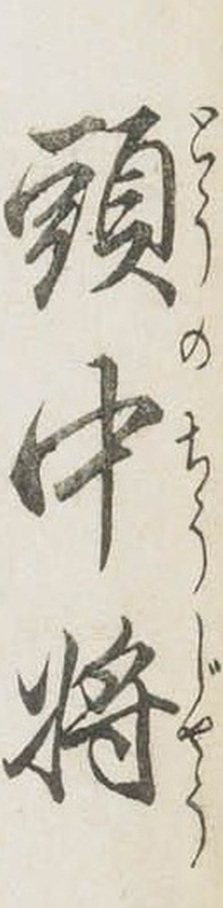頭中将
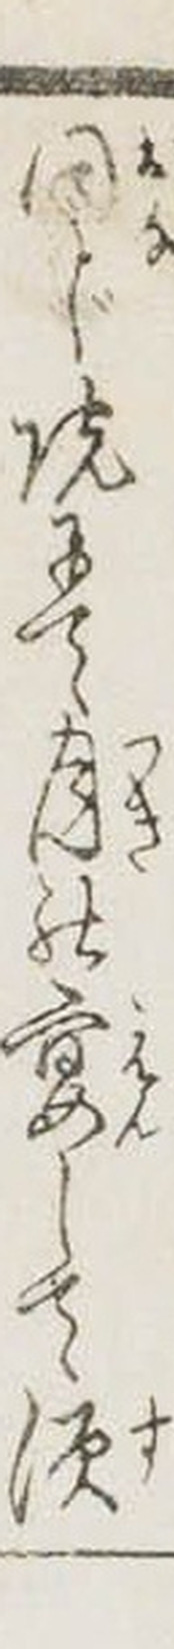同じ院にて月の宴して須
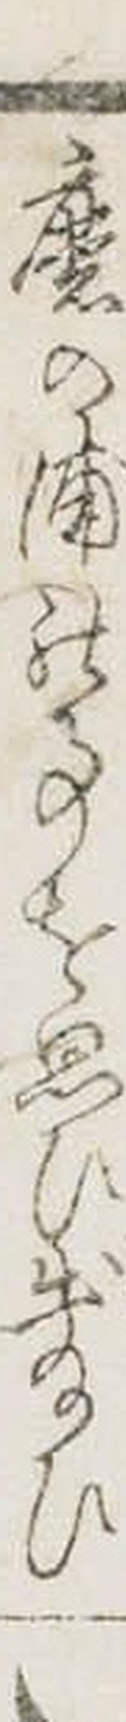磨の浦の事を思ひ出給ひ
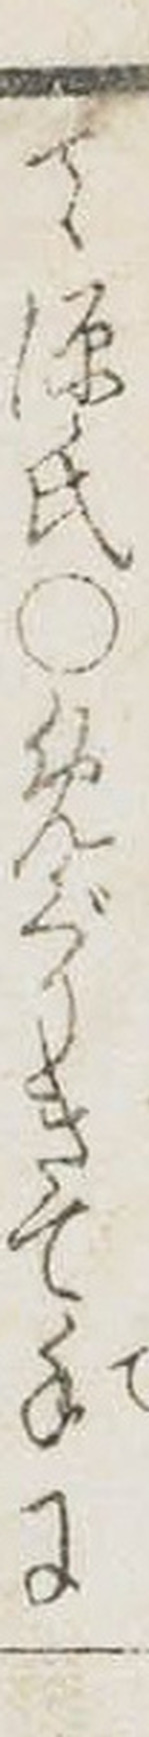て源氏○めぐりきて手に
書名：源氏百人一首
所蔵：東京学芸大学教育コンテンツアーカイブ
